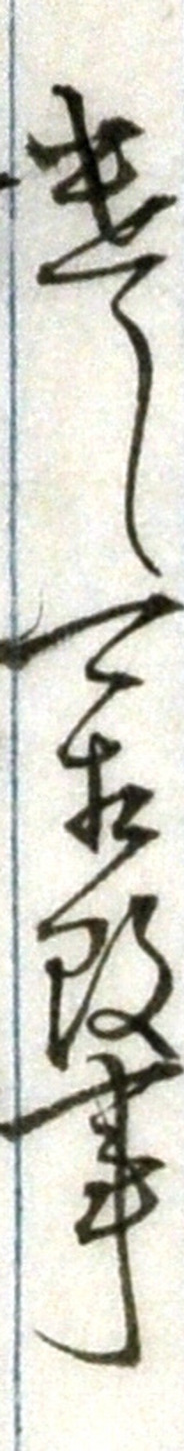遣し可相改事
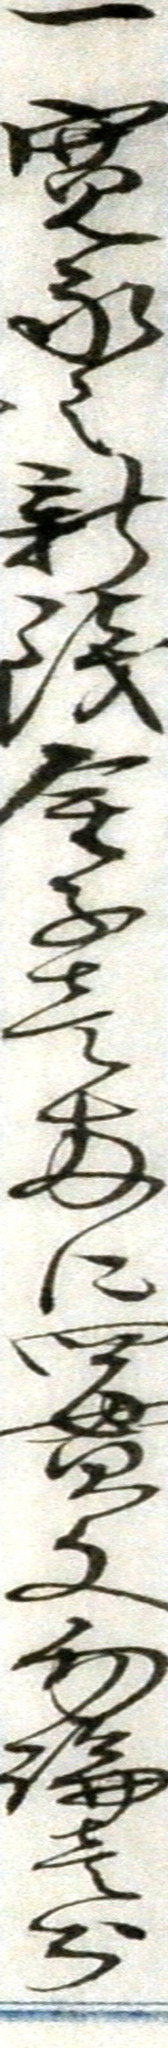一寛永之新銭金子壱両に四貫文勿論壱分
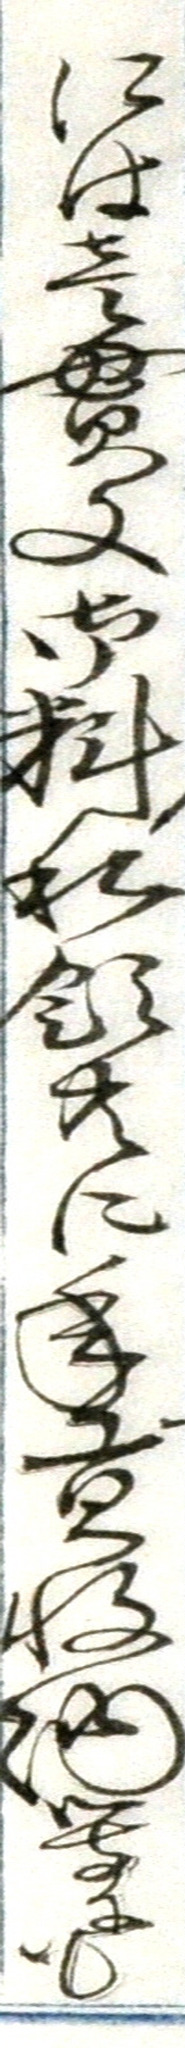には壱貫文御料私領共に年貢収納等にも

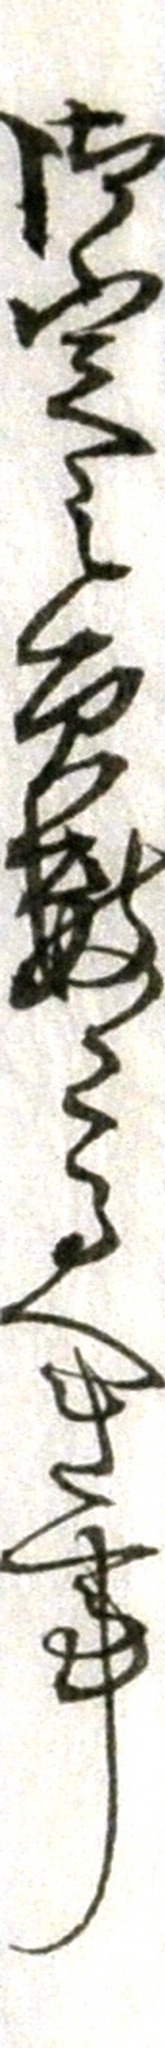御定之員数たるへき事
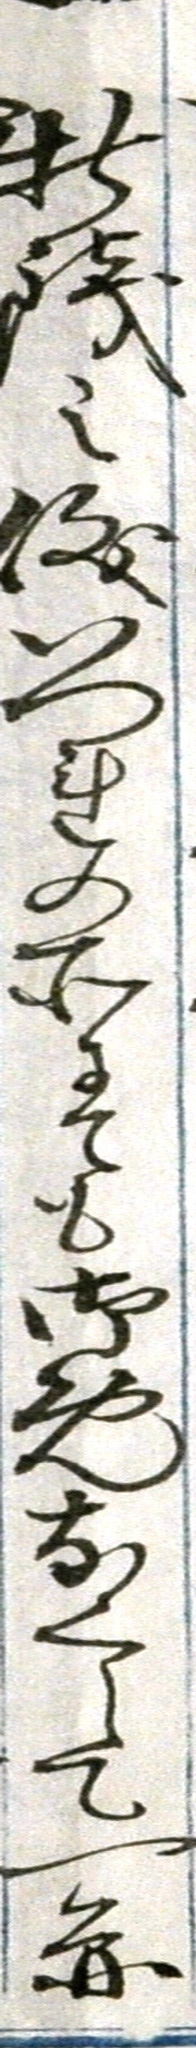一新銭之儀いつれの所にても御免なくして一円
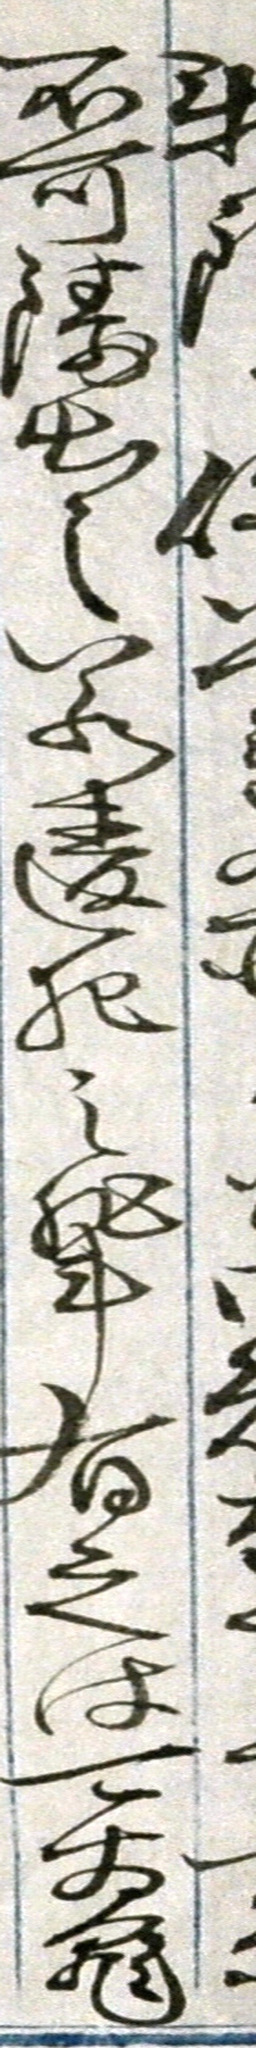不可鋳出之若違犯之輩有之は可為罪
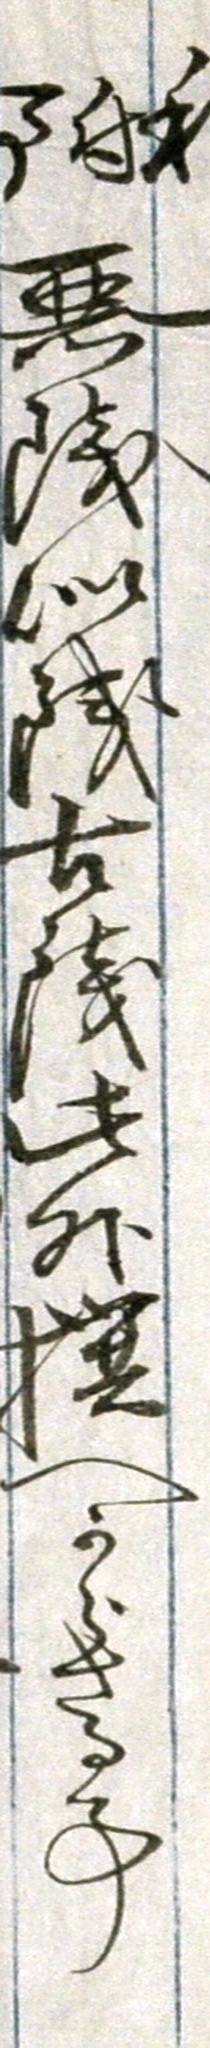附悪銭似銭古銭此外撰へからさる事
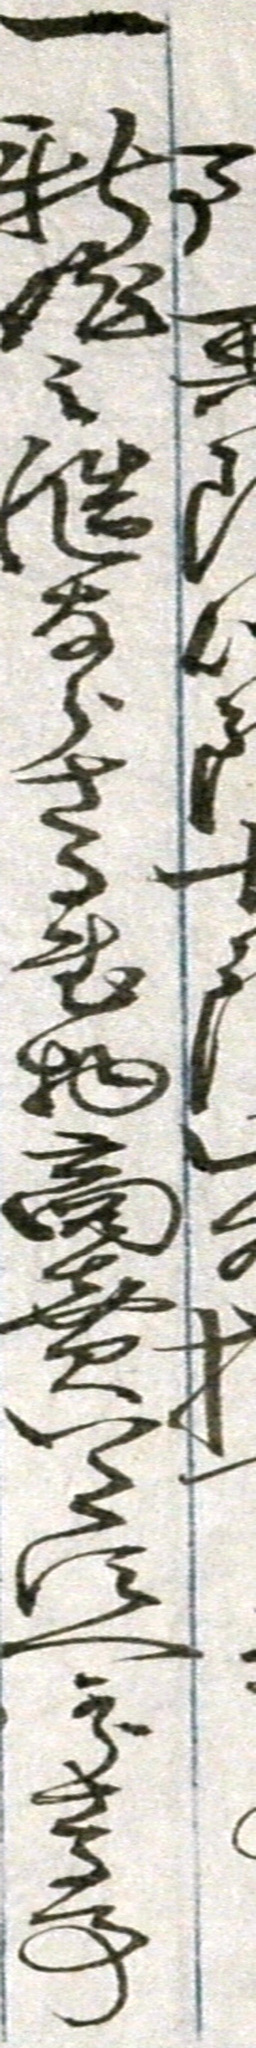一新作之慥ならさる書物商売いたすへからさる事
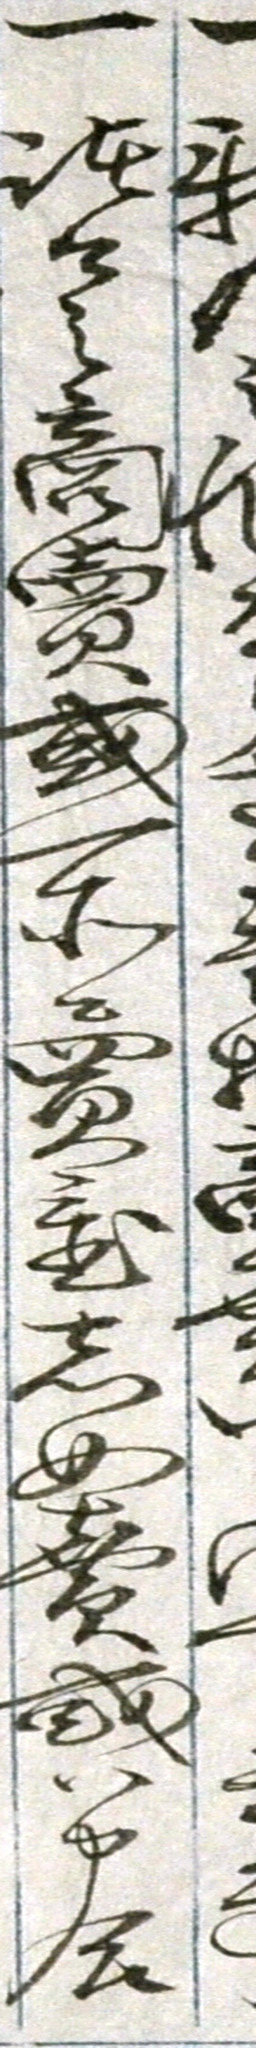一諸々之商売或一所ニ買置しめ売或は申合
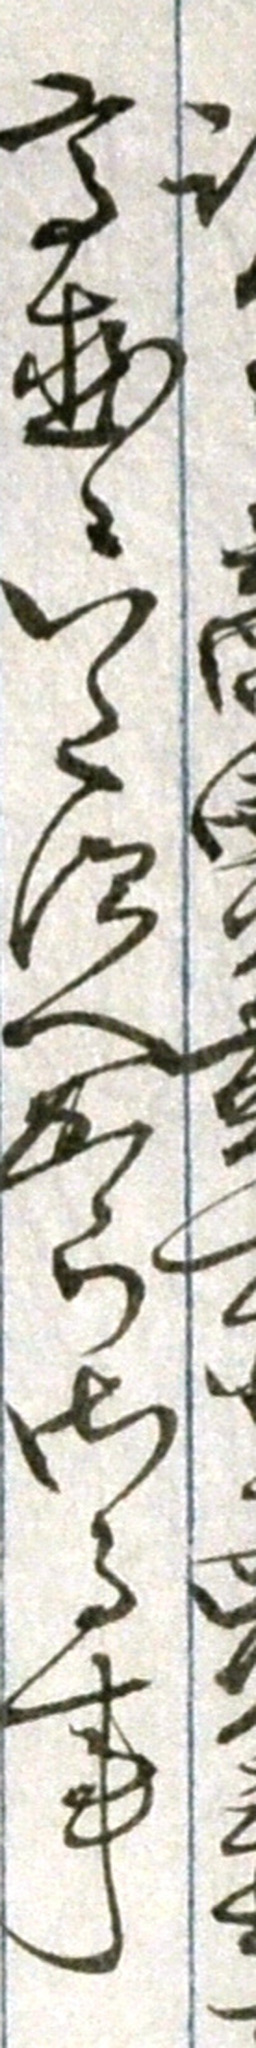高直にいたすへからさる事
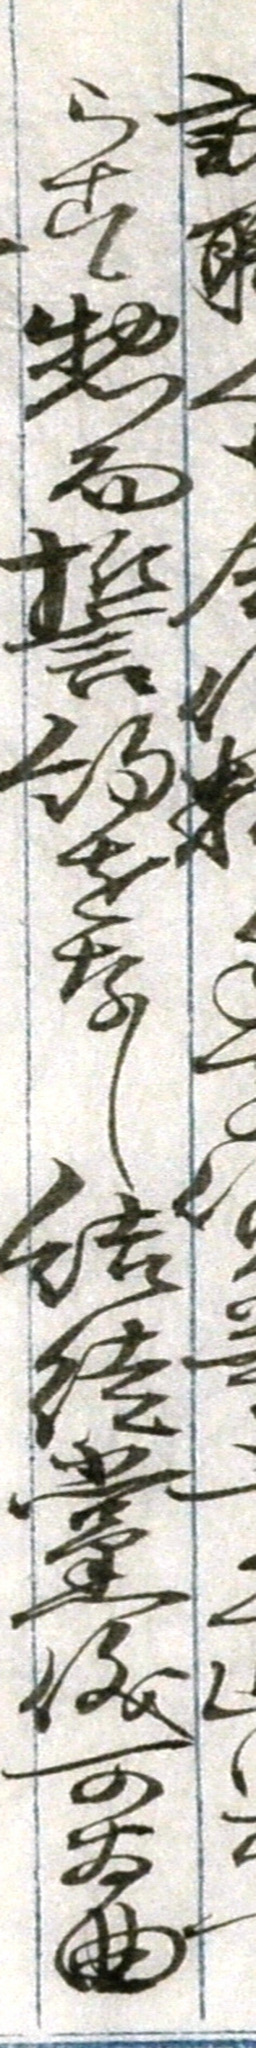らす惣而制約をなし結徒党儀可為曲
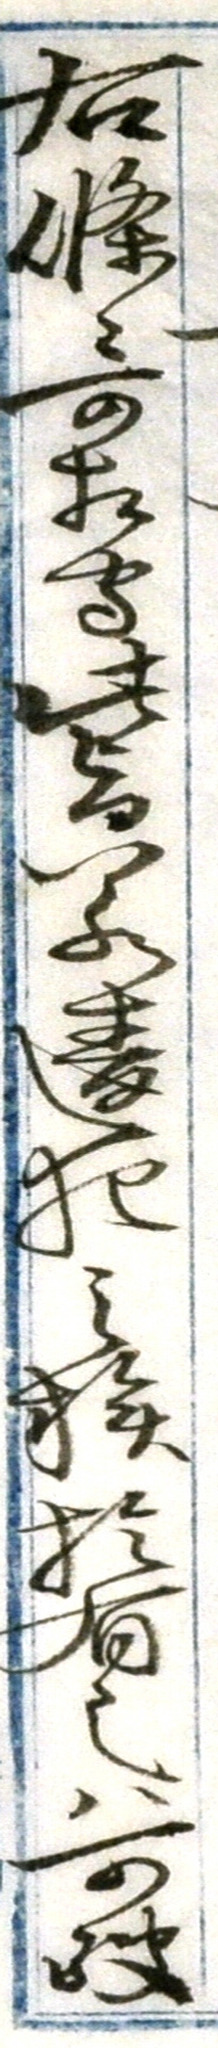右条々可相守此旨若違犯之族於有之は可被
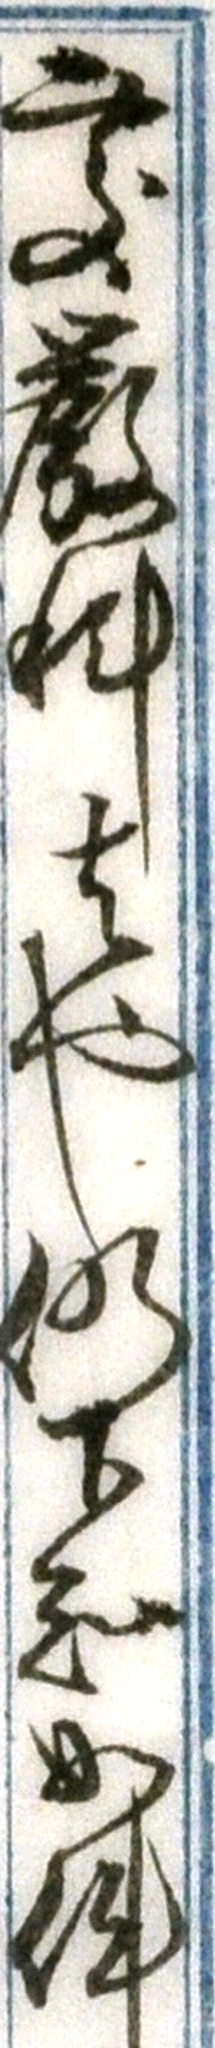処厳科者也仍下知如件
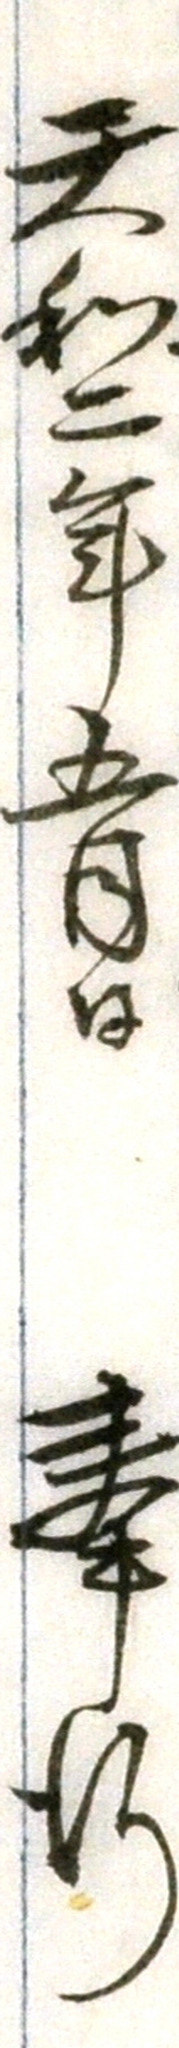天和二年五月日奉行

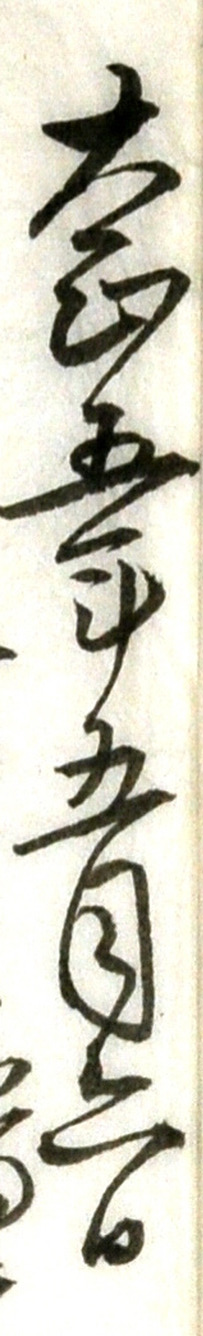大正五年五月六日
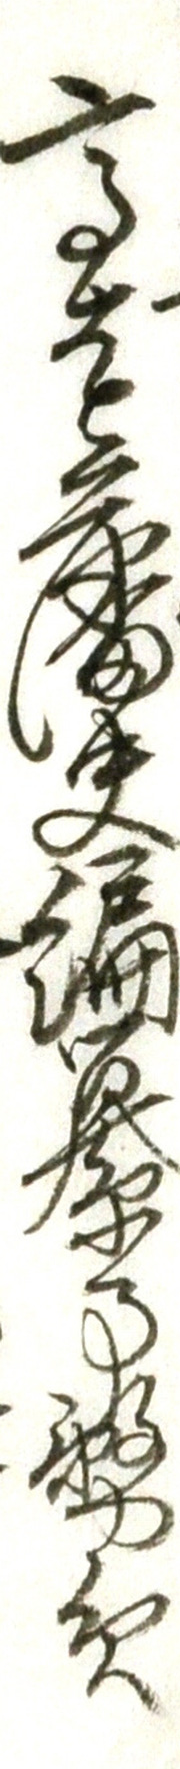高遠藩史編纂事務員
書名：御高札之写
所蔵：伊那市立高遠町図書館・合同会社AMANE
